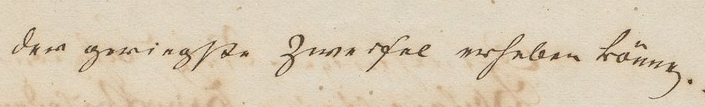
der geringste Zweifel erhaben könne. –
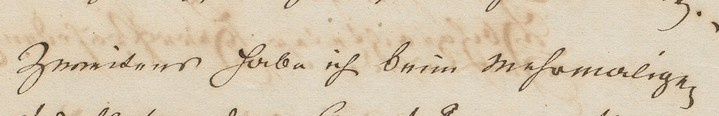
Zweitens habe ich beim mehrmaligen
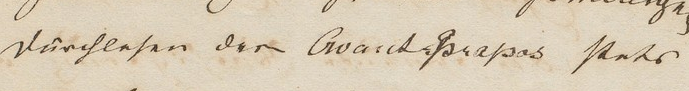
Durchlesen des Avantpropos stets
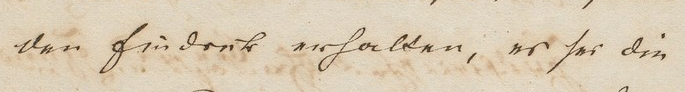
den Eindruk erhalten, es sei die
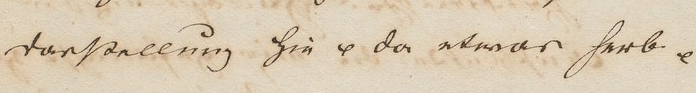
Darstellung hie & da etwas herb
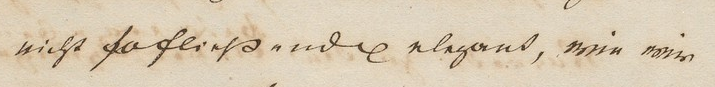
nicht so fließend &elegant, wie wir
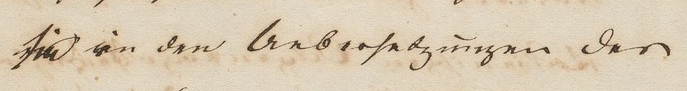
sie in den Uebersetzungen des
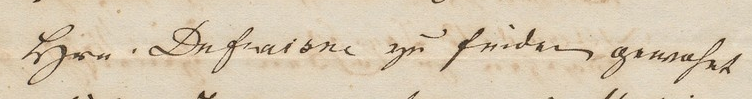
Hrn. Dufraisne zu finden gewohnt
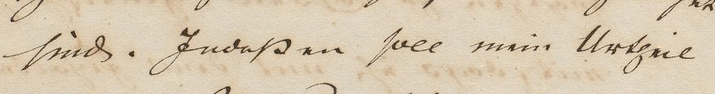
sind. Indeßen soll mein Urtheil
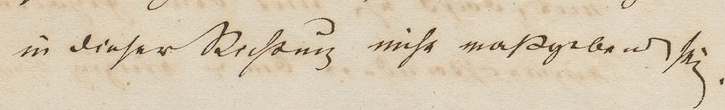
in dieser Richtung nicht maßgebend sein. –
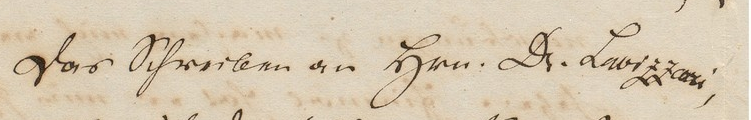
Das Schreiben an Hrn. Dr. Lavizzari
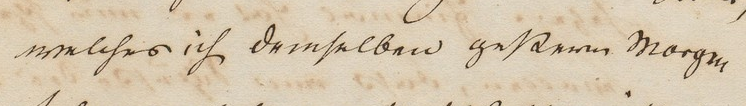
welches ich demselben gestern Morgen
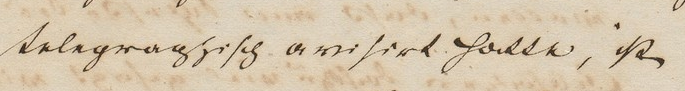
telegraphisch avisirt hatte, ist
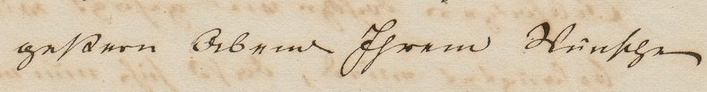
gestern Abend Ihrem Wunsche
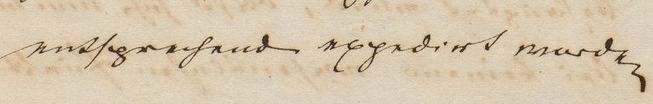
entsprechend expedirt worden.
